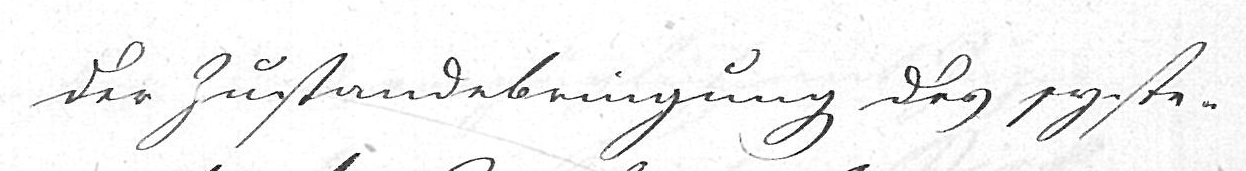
der Zustandebringung des syste-
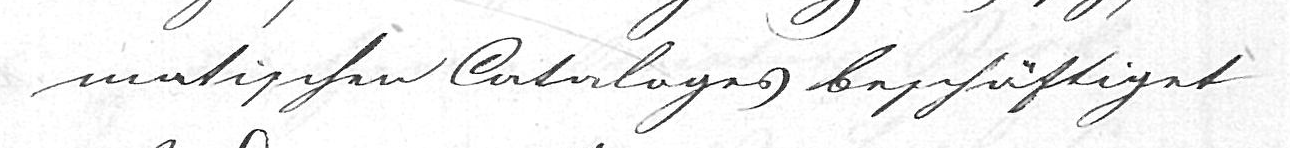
matischen Cataloges beschäftiget
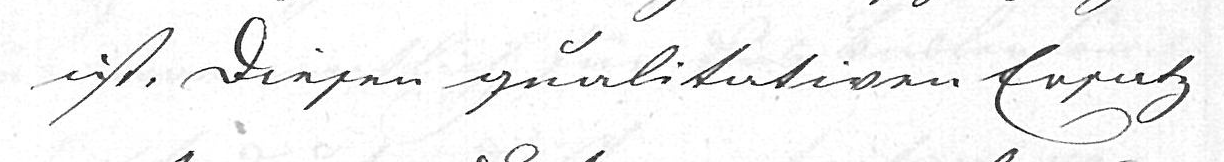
ist. Diesen qualitativen Ersatz
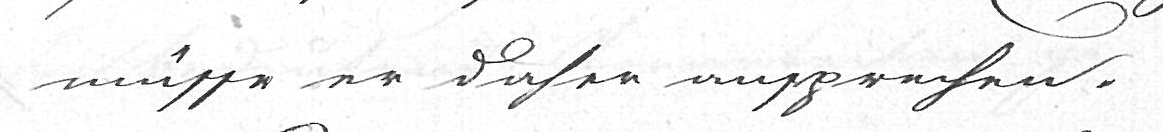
müsse er daher ansprechen.
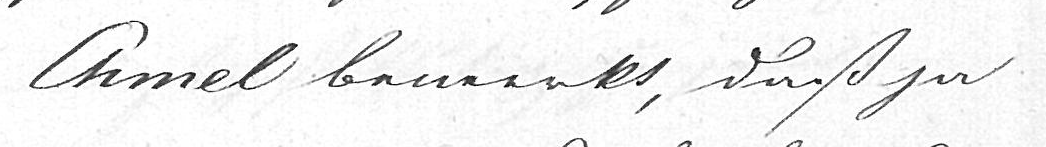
Chmel bemerkt, daß ja
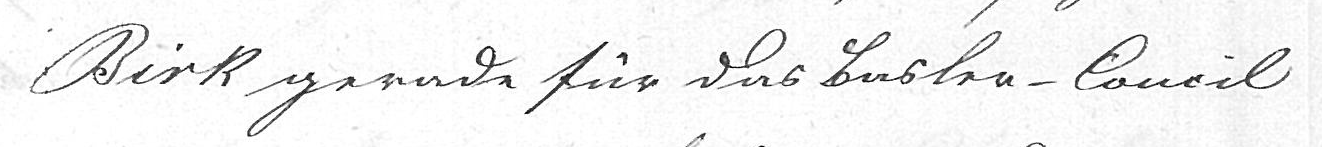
Birk gerade für des Basler-Concil
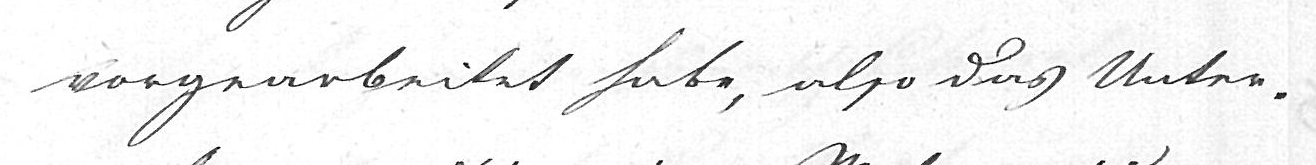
vorgearbeitet habe, also das Unter-
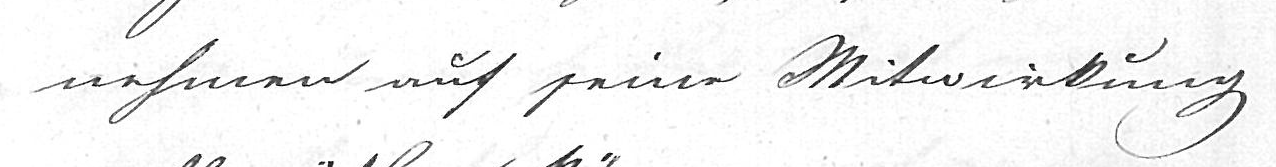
nehmen auf seine Mitwirkung
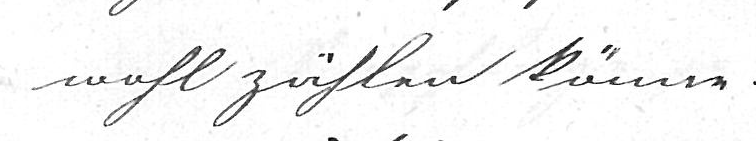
wohl zählen könne.
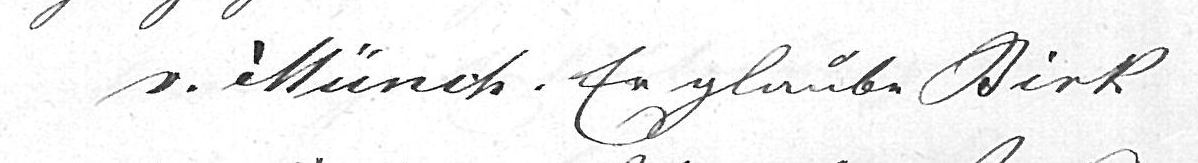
v. Münch. Er glaube Birk
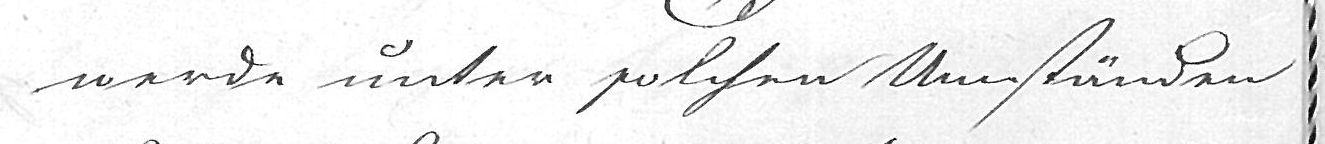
werde unter solchen Umständen
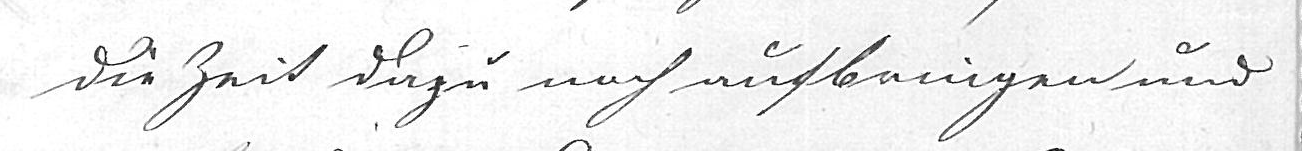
die Zeit dazu noch aufbringen und
